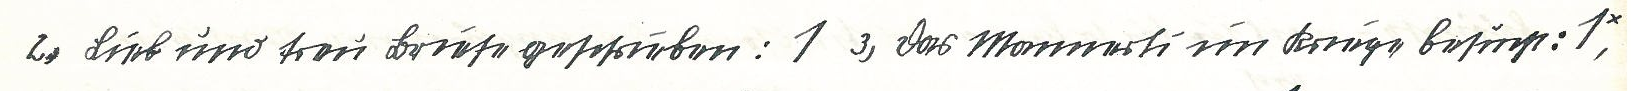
2) Lieb und treu Briefe geschrieben: 1 3) Das Mannerli im Kriege besucht: 1x,
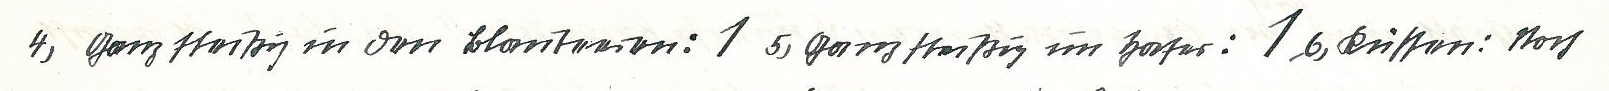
4) Ganz fleißig in den Blaubeeren: 1 5) Ganz fleißig im Hafer: 1, 6) Küssen: Noch
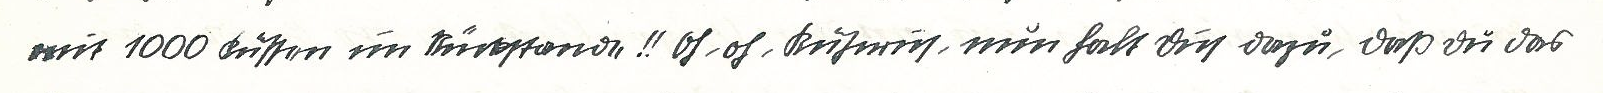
mit 1000 Küssen im Rückstand!! Oh, oh, nun halt Dich dazu, daß Du das
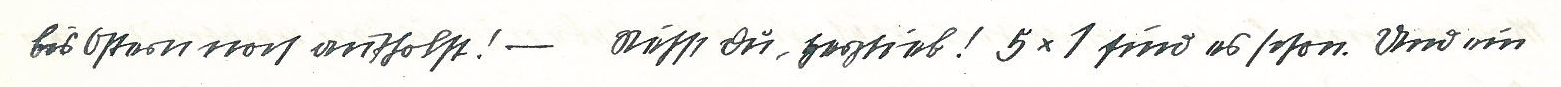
bis Ostern noch aufholst! – Siehst Du, Herzlieb! 5 x 1 sind es schon. Und ein
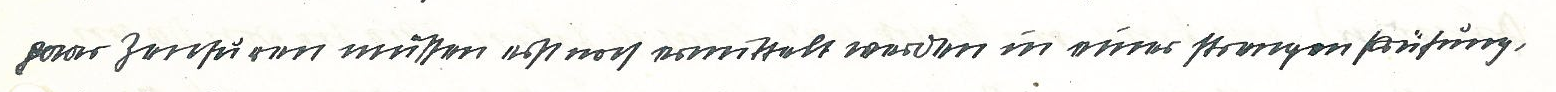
paar Zensuren müssen erst noch ermittelt werden in einer strengen Prüfung,
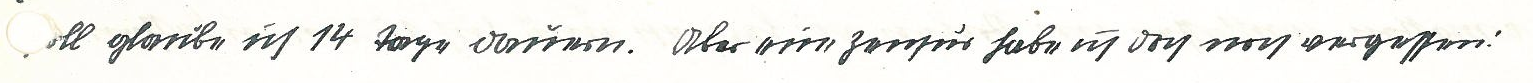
ll, glaube ich, 14 Tage dauern. Aber eine Zensur habe ich doch noch vergessen:
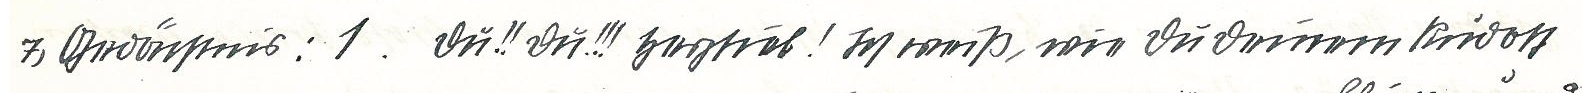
7) Gedächtnis: 1. Du!! Du!!! Herzlieb! Ich weiß, wie Du Deinem Rudolf
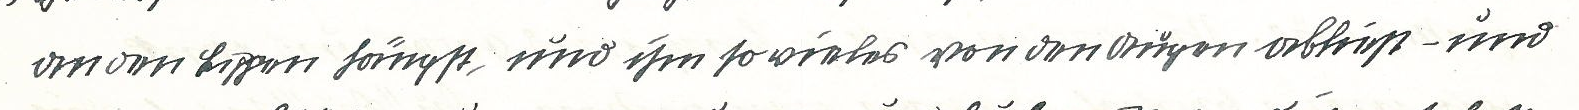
an den Lippen hängst, und ihm so vieles von den Augen abliest – und
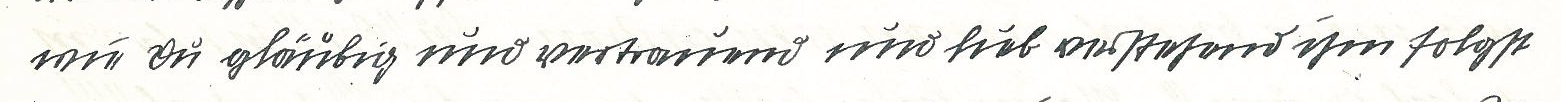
wie Du gläubig und vertrauend und lieb verstehend ihm folgst
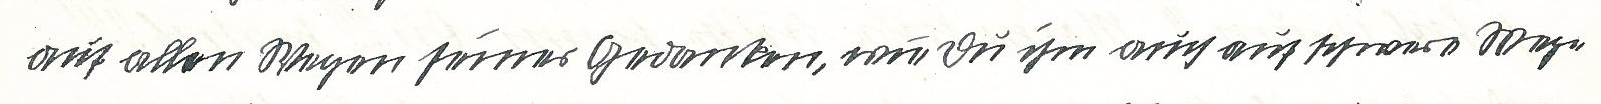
auf allen Wegen seiner Gedanken, wie Du ihm auch auf schwere Wege
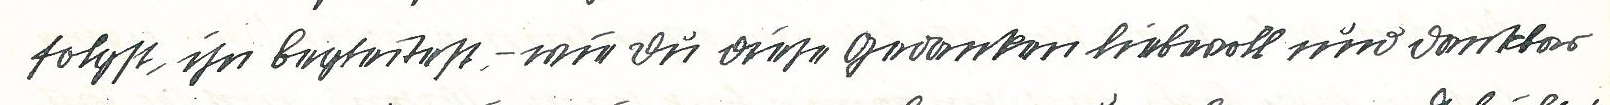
folgst, ihn begleitest, – wie Du diese Gedanken liebevoll und dankbar
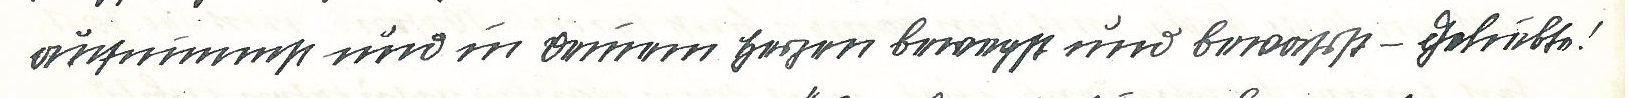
aufnimmst und in Deinem Herzen bewegst und bewahrst – Geliebte!
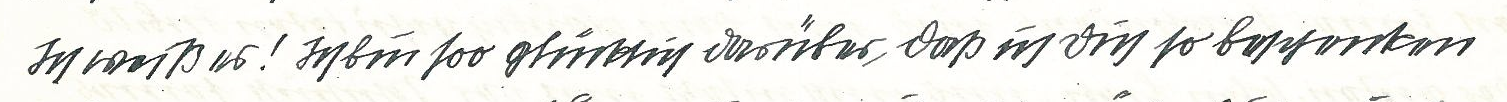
Ich weiß es! Ich bin soo glücklich darüber, daß ich Dich so beschenken
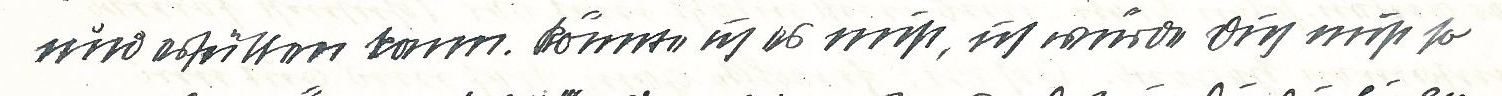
und erfüllen kann. Könnte ich es nicht, ich würde Dich nicht so
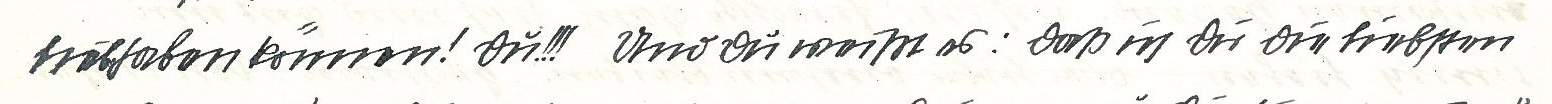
lieb haben können! Du!!! Und Du weißt es: daß ich Dir die liebsten
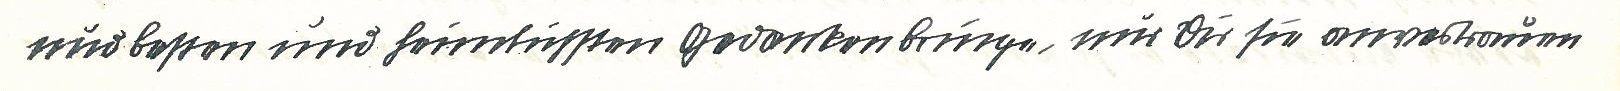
und besten und heimlichsten Gedanken bringe, nur Dir sie anvertrauen
